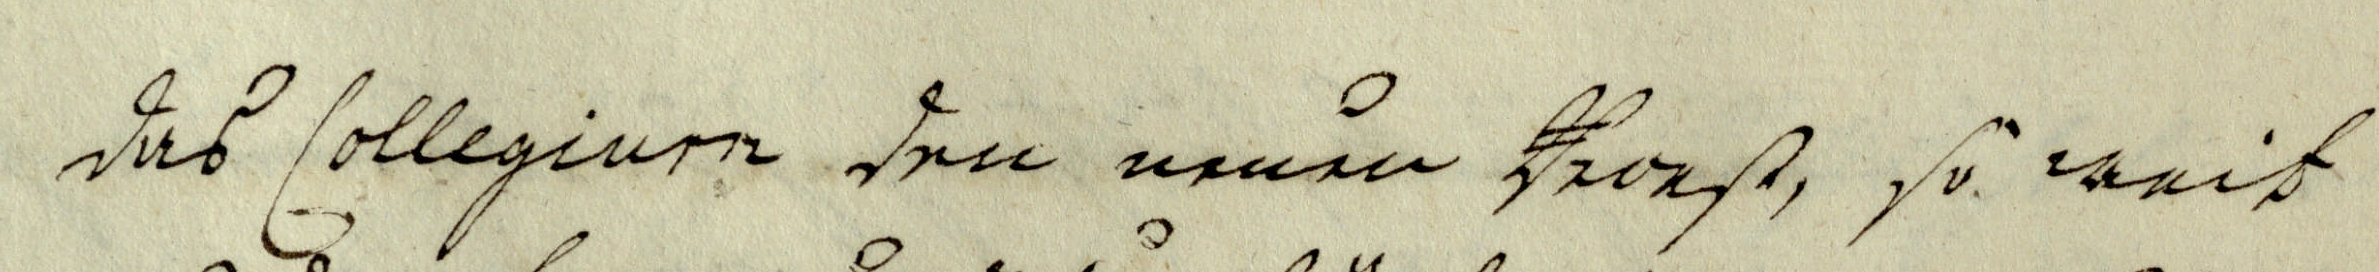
das Collegium den neuen Receß, so weit
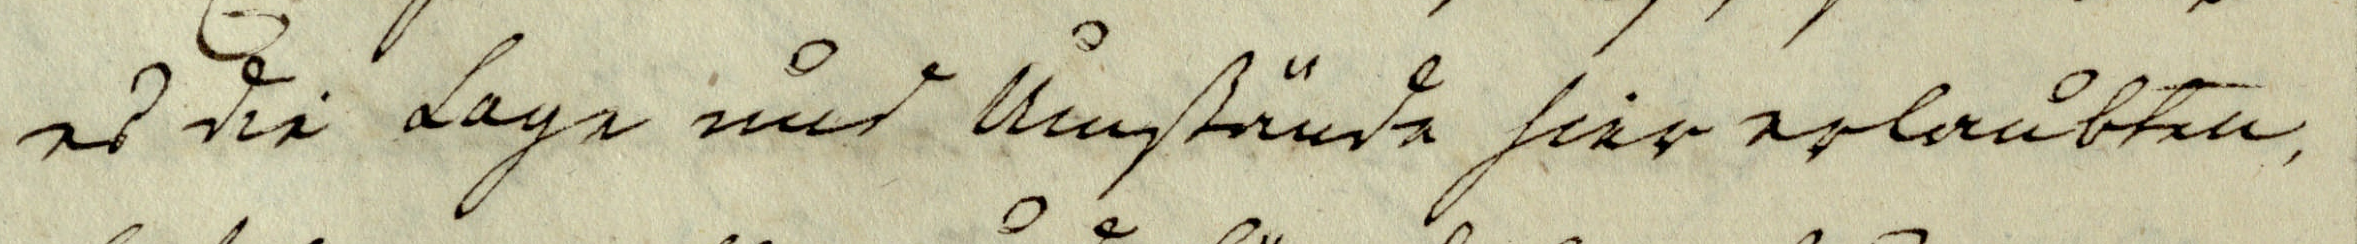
es die Lage und Umstände hier erlaubten,
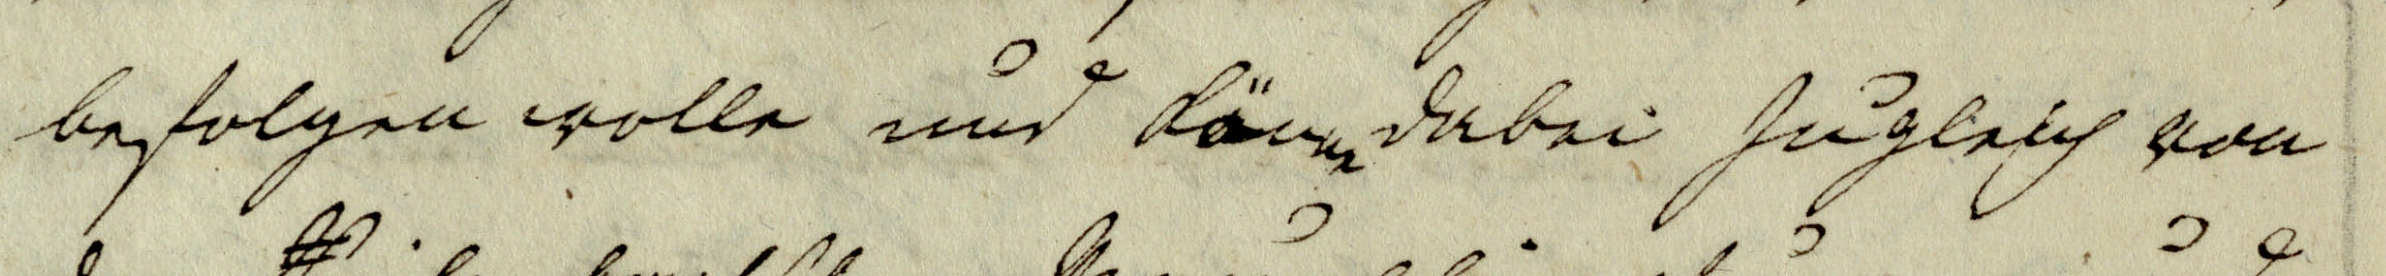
befolgen wolle und könne dabei zugleich von
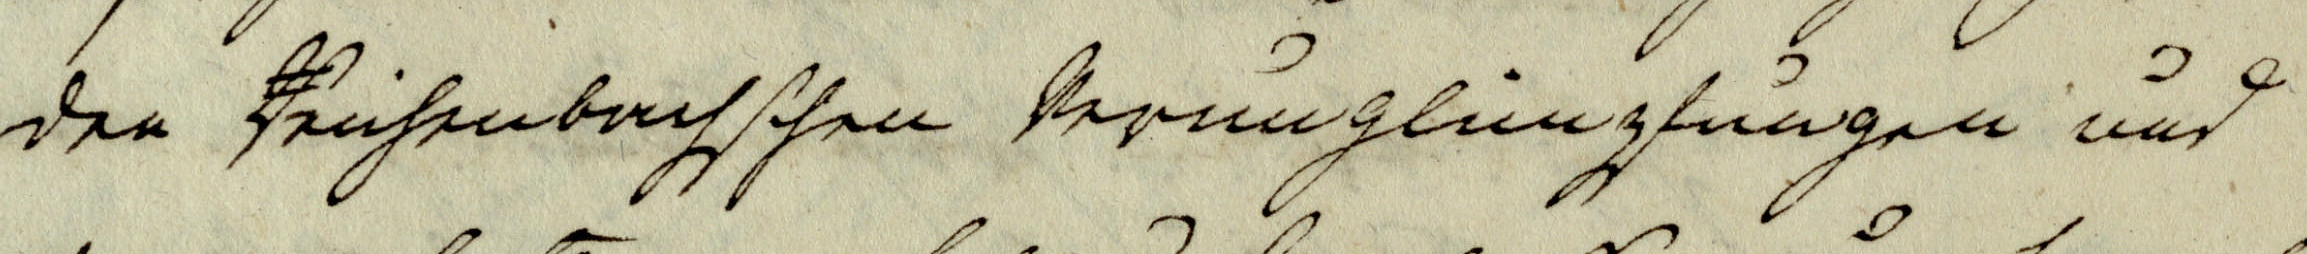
den Reichenbachschen Verunglimpfungen und
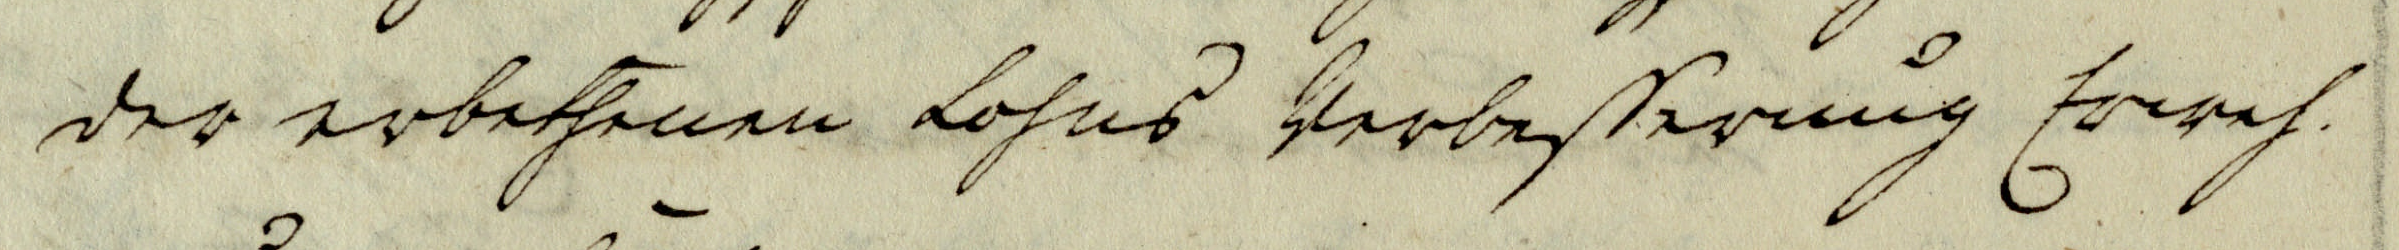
der erbethenen Lohns Verbesserung Erweh¬
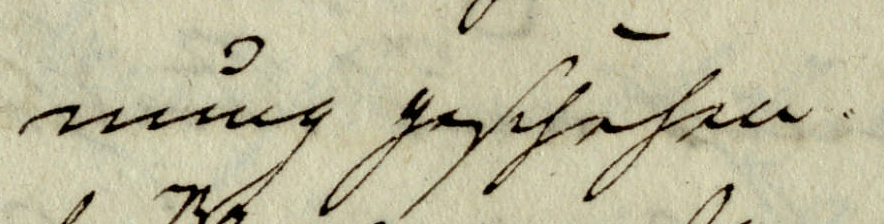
nung geschehen
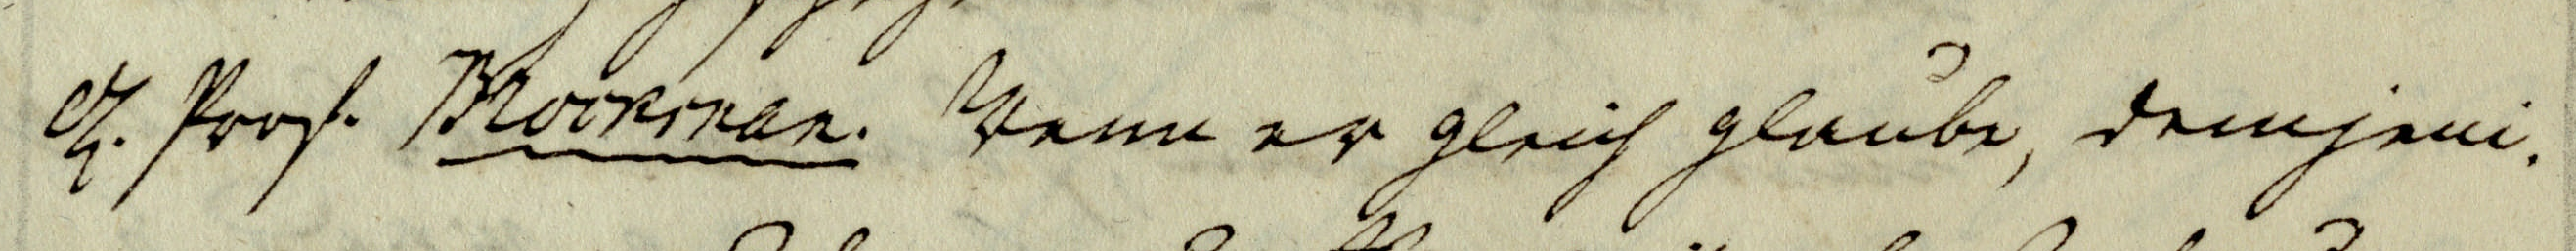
dh. Prof. Brockman. Wenn er gleich glaube, demjeni¬
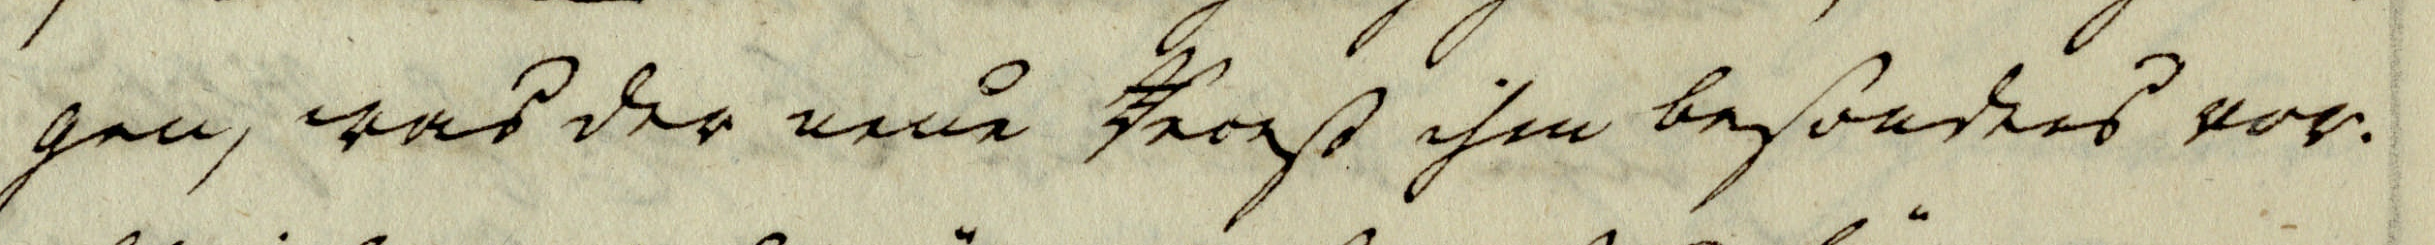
gen, was der neue Receß ihm besonders vor¬
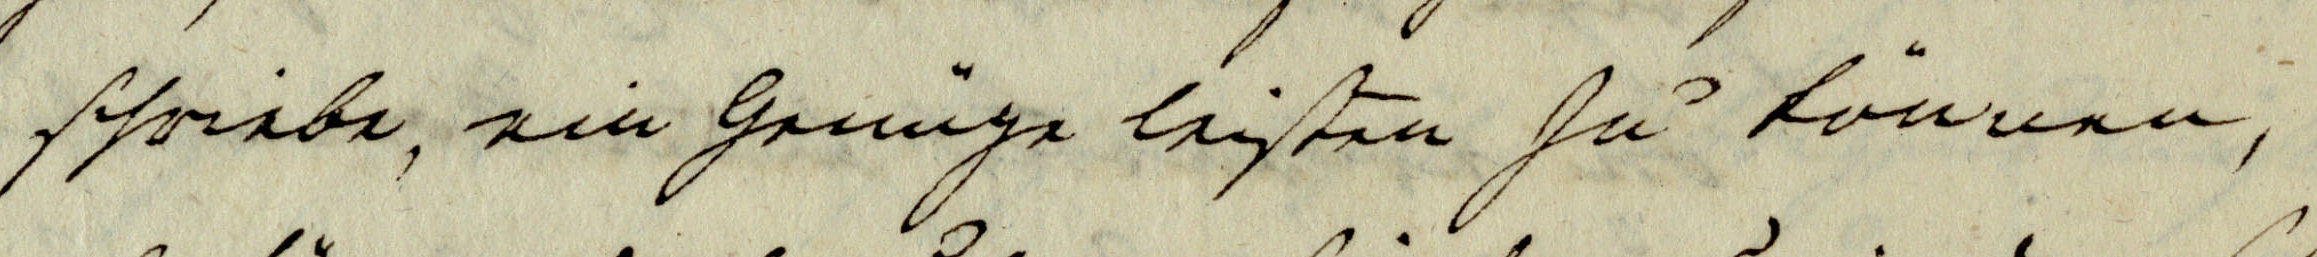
schriebe, ein Genüge leisten zu können,
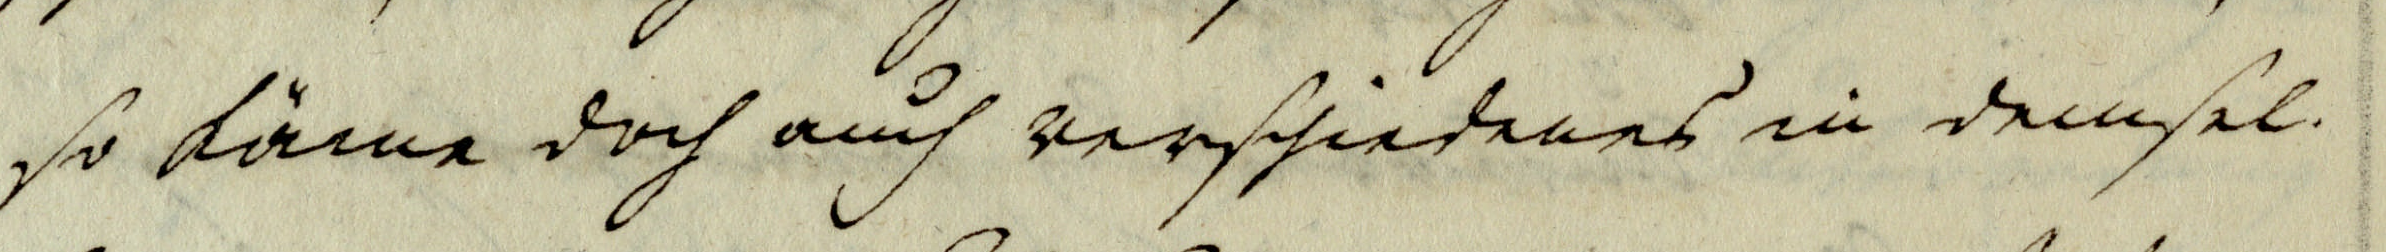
so käme doch auch verschiedenes in demsel¬
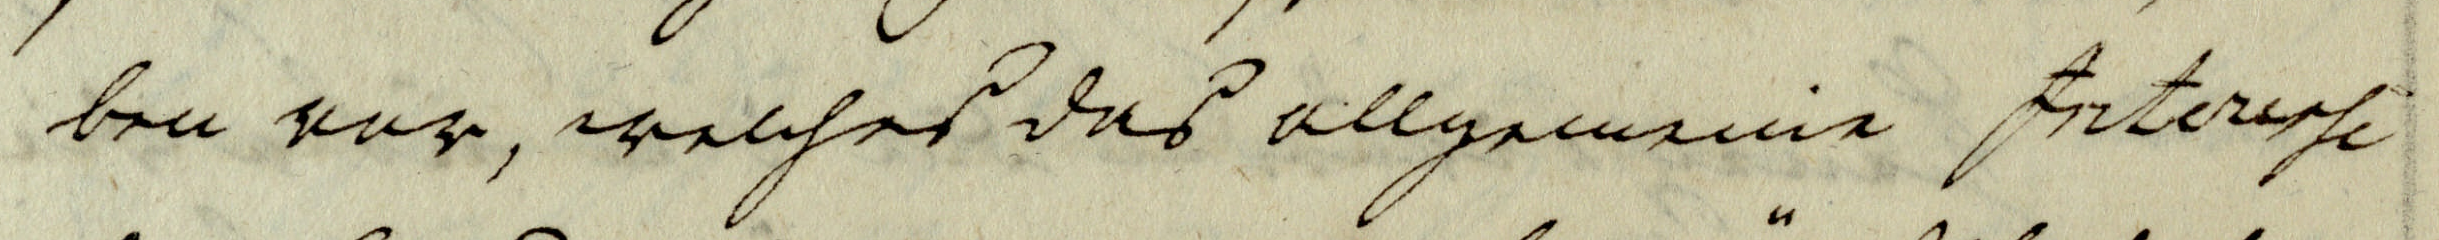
ben vor, welches das allgemeine Interesse
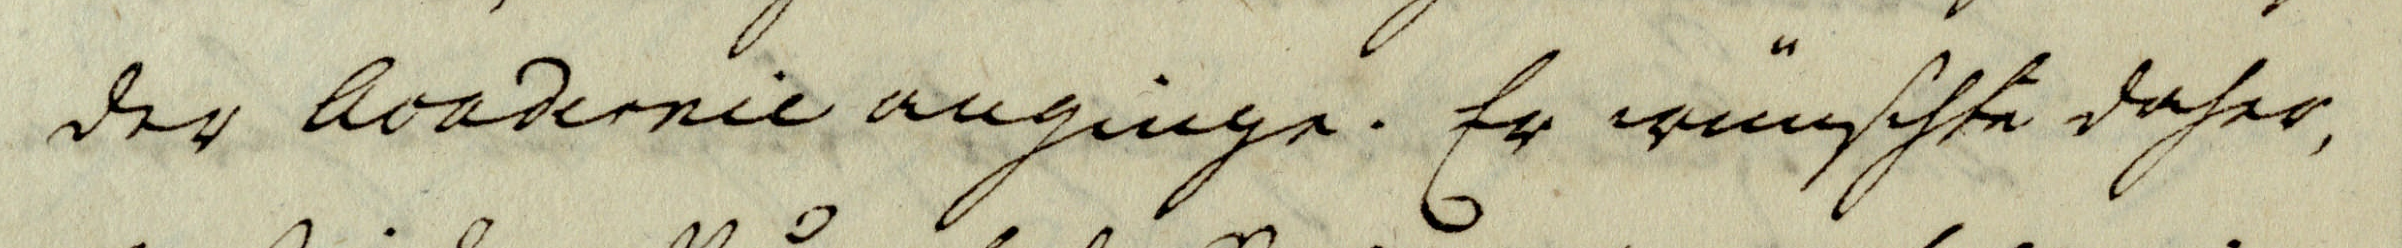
der Academie anginge. Er wünschte daher,
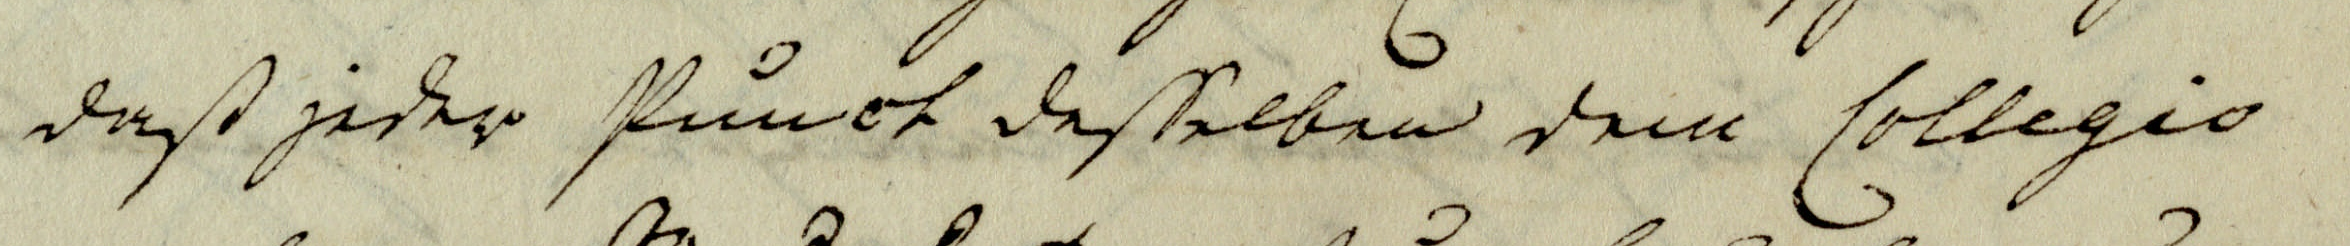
daß jeder Punct desselben dem Collegio
